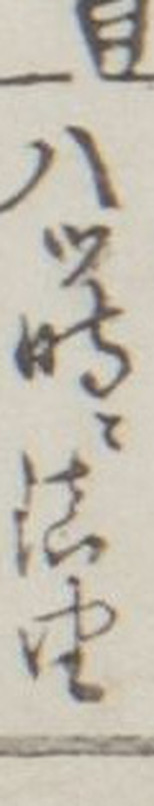八ツ時に鎮火
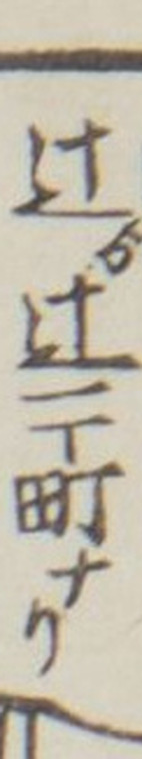辻ゟ辻一丁町なり
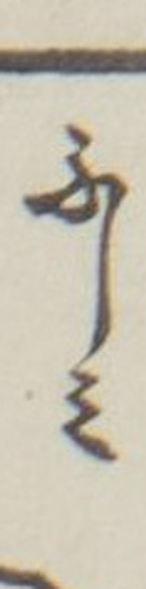ふしみ
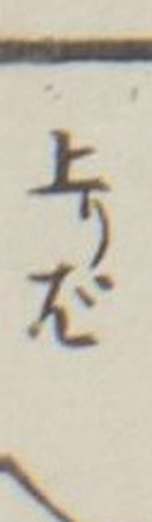上りば
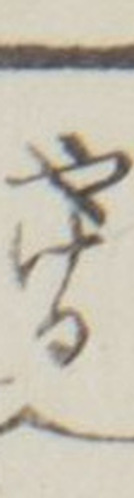やける
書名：本しらべ京都大火の説後編
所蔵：あいおいニッセイ同和損保株式会社
